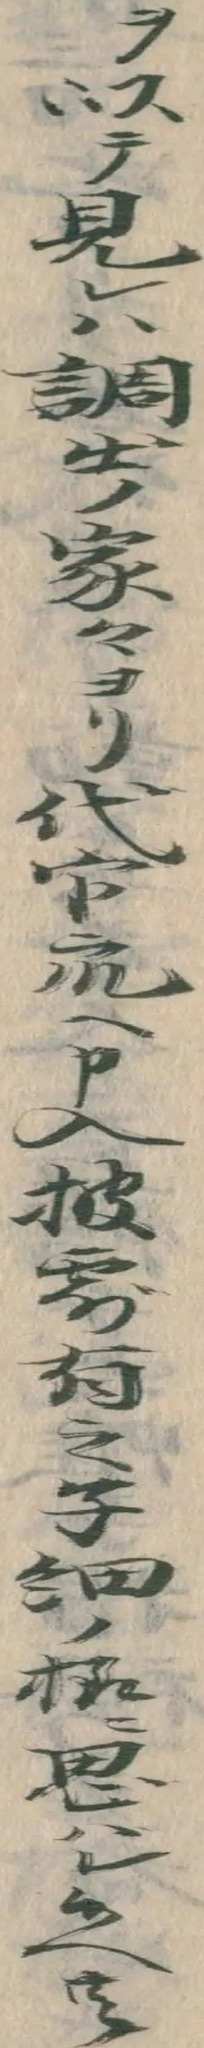ヲ以テ見レハ調出ノ家々ヨリ代官衆ヘ申入披露有之子細ノ様ニ思ハレ候ヘ共
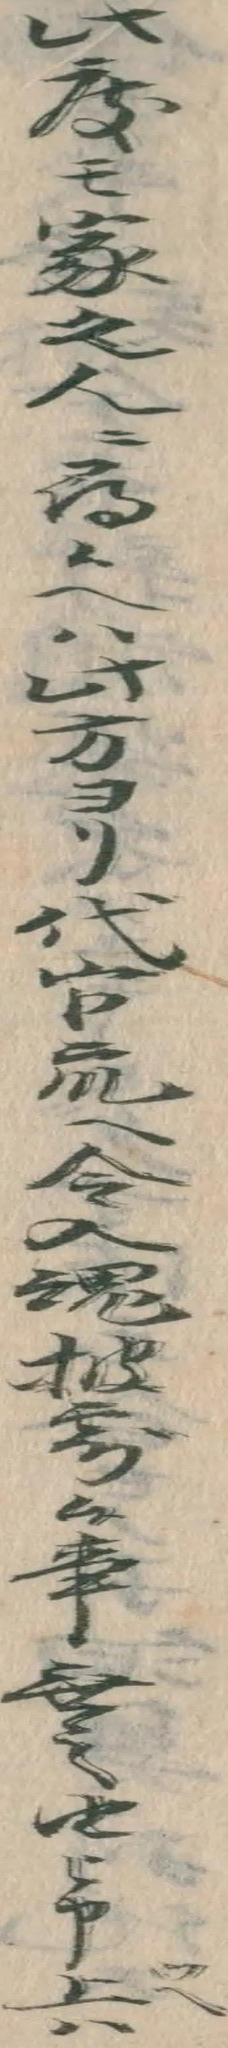此度モ家之人ニ尋候ヘハ此方ヨリ代官衆へ令入魂披露候事無之由被申上ハ
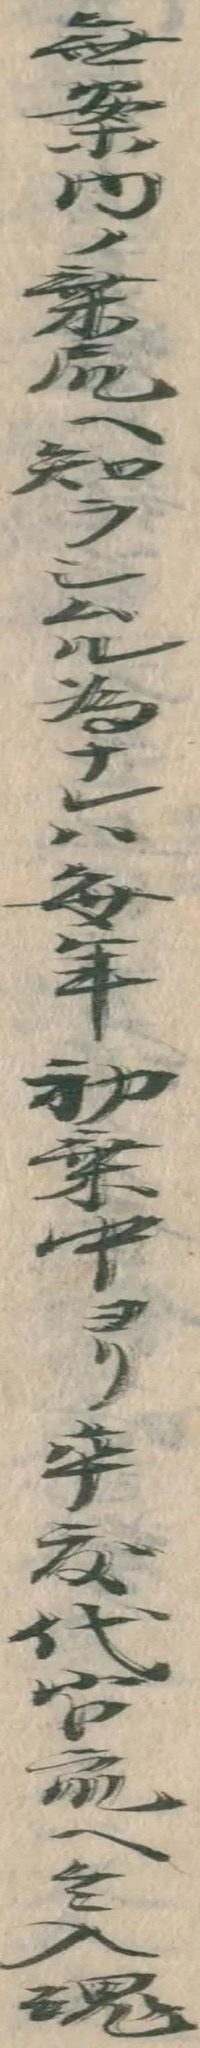無案内ノ乗尻ヘ知ラシムル為ナレハ毎年初乗中ヨリ卒度代官衆へ令入魂
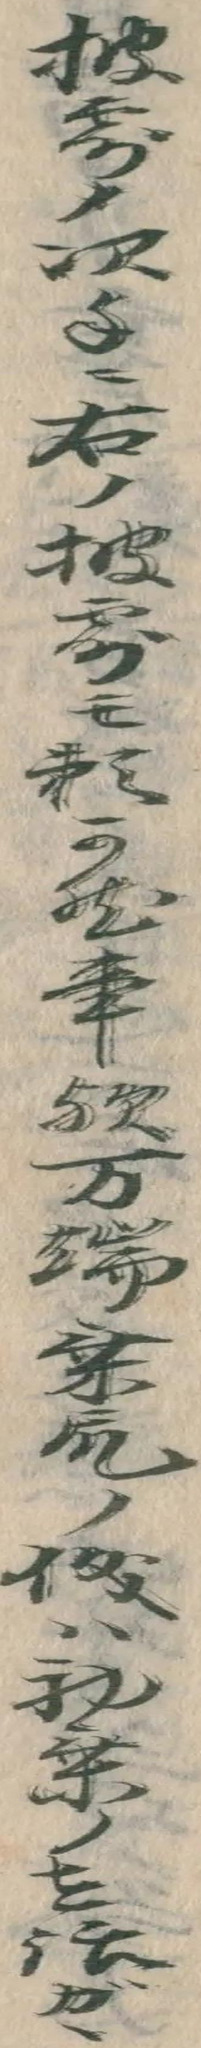披露ノ次トニ右ノ披露モ頼可然事歟万端乗尻ノ儀ハ初乗ノ世話ガヽ
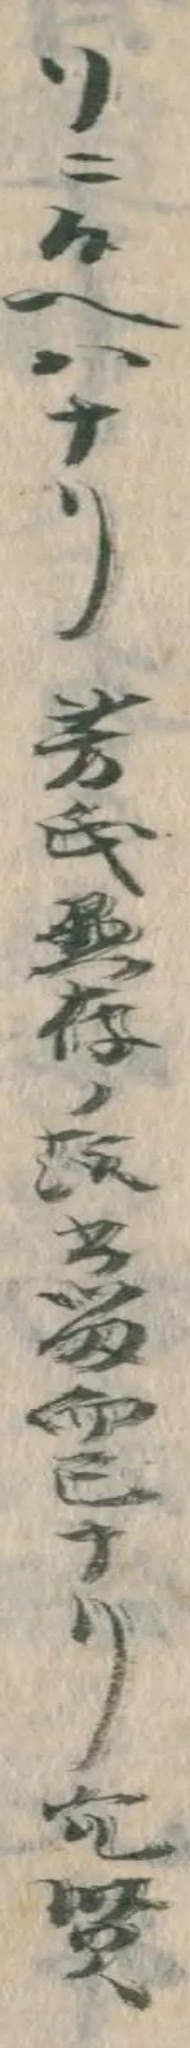リニ候ヘハナリ芳氏愚存ノ故書留而已ナリ穴賢
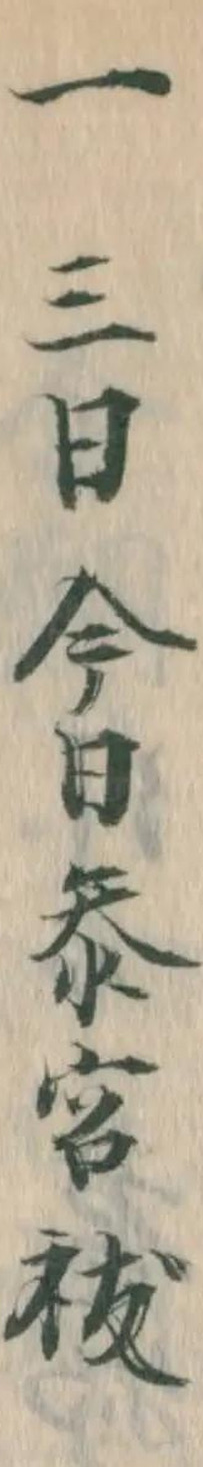一三日今日参宮祓
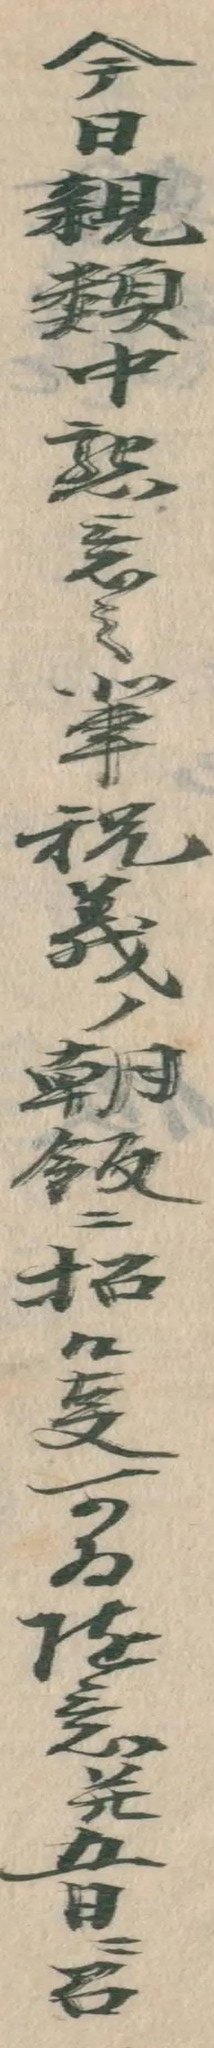今日親類中懇意之輩祝義ノ朝飯ニ招候事可為随意并五日ニ召

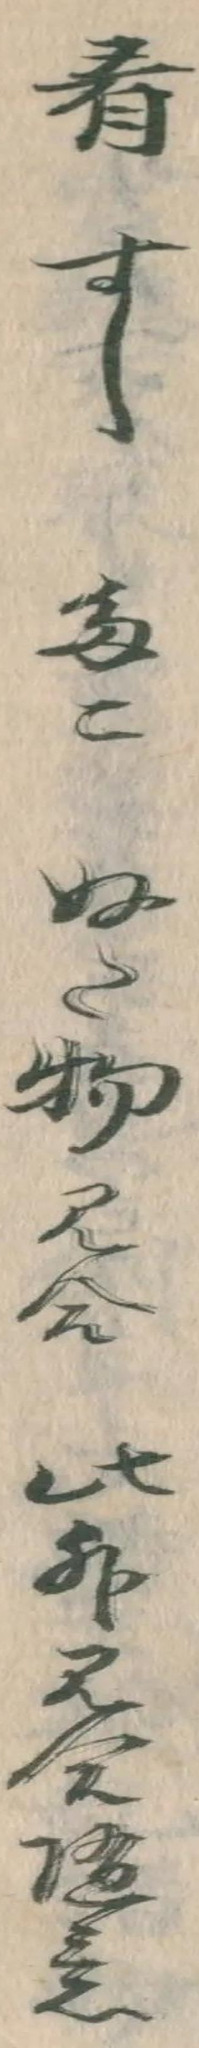肴すしたこぬた物見合此外見合随意
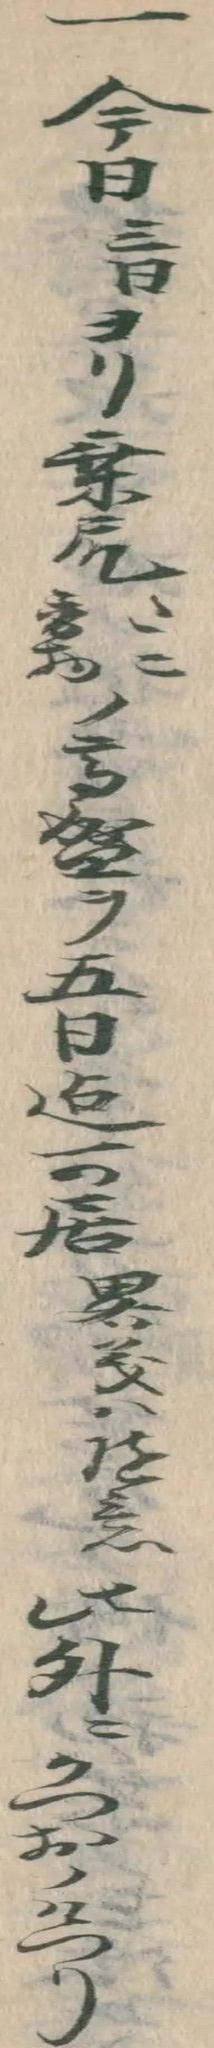一今日三日ヨリ乗尻たこ香物ノ高盛ヲ五日迄可居略義ハ随意此外ニかつおノけつり
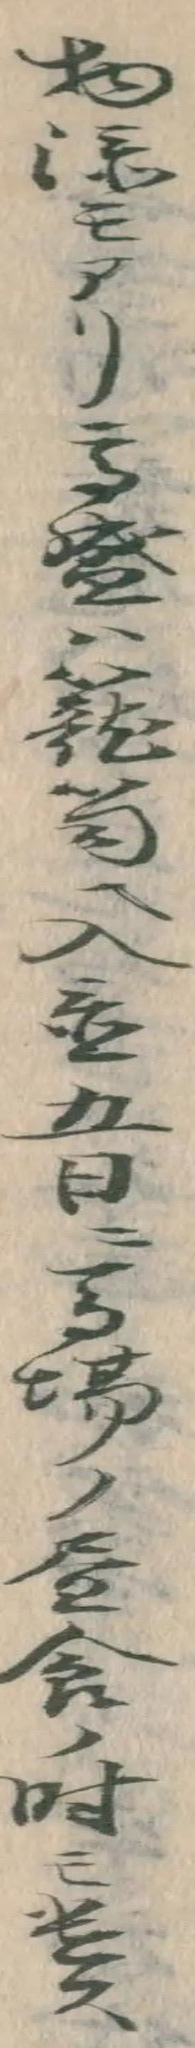物添モアリ高盛ハ籠笥へ入置五日ニ馬場ノ昼食ノ時モ遣ス
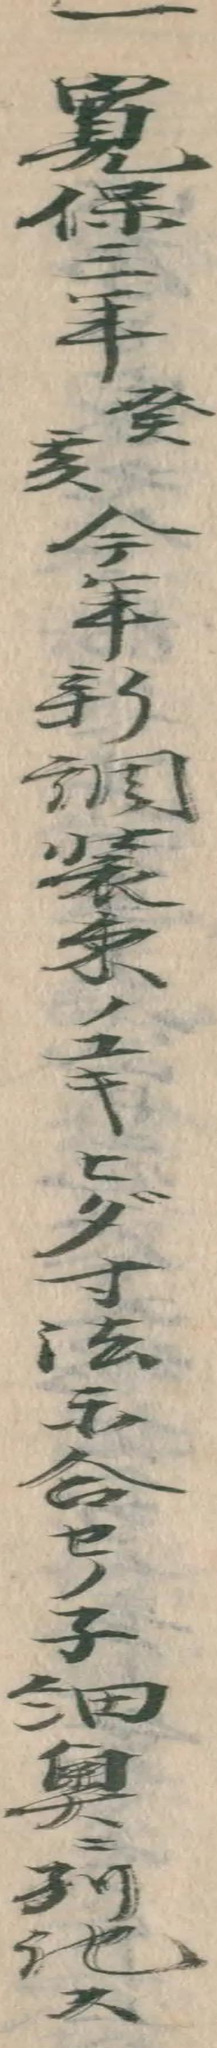一寛保三年癸亥今年新調装束ノユキヒダ寸法示合セノ子細奥ニ別記ス
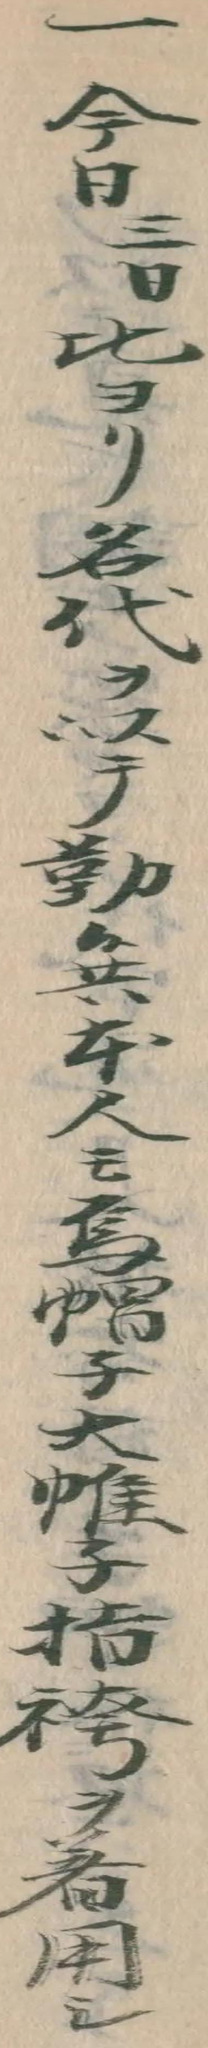一今日三日比ヨリ名代ヲ以テ勤候共本人モ烏帽子大帷子指袴ヲ着用シ
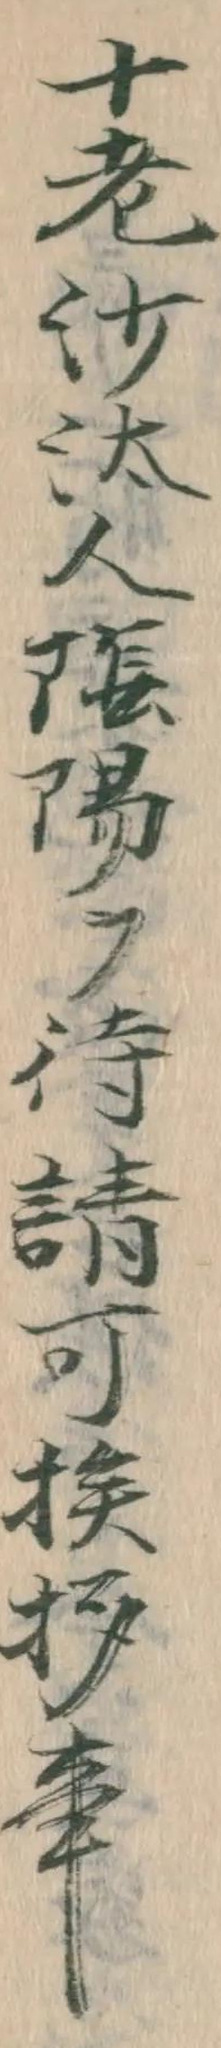十老沙汰人陰陽ヲ待請可挨拶事
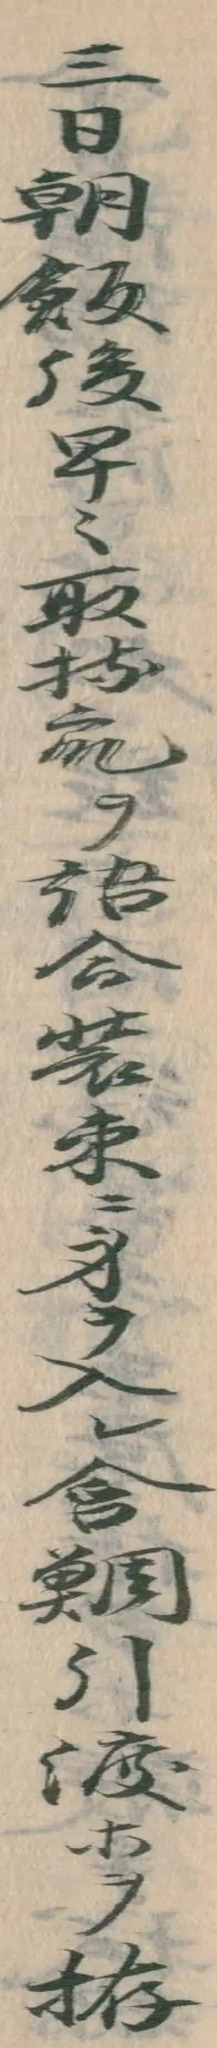一三日朝飯後早々取持衆ヲ語合装束ニ身ヲ入レ含鯛引渡等ヲ拵
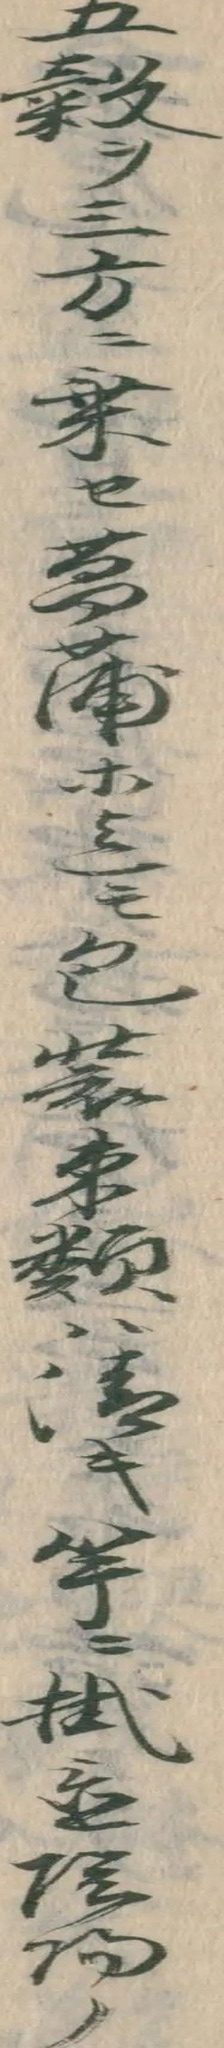五穀ヲ三方ニ乗セ菖蒲等迄モ包装束類ハ清キ竿ニ掛置陰陽ノ
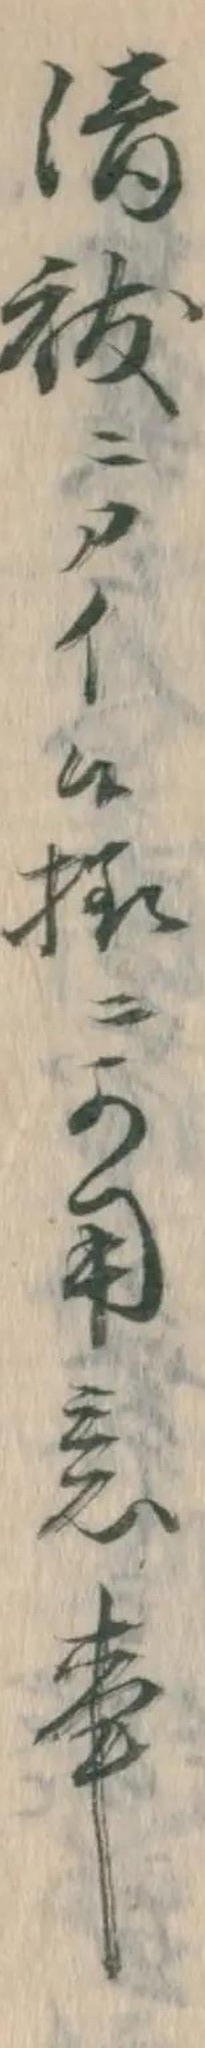清祓ニアイ候様ニ可用意事
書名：賀茂社記録. 第11冊
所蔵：国立国会図書館 National Diet Library, JAPAN
